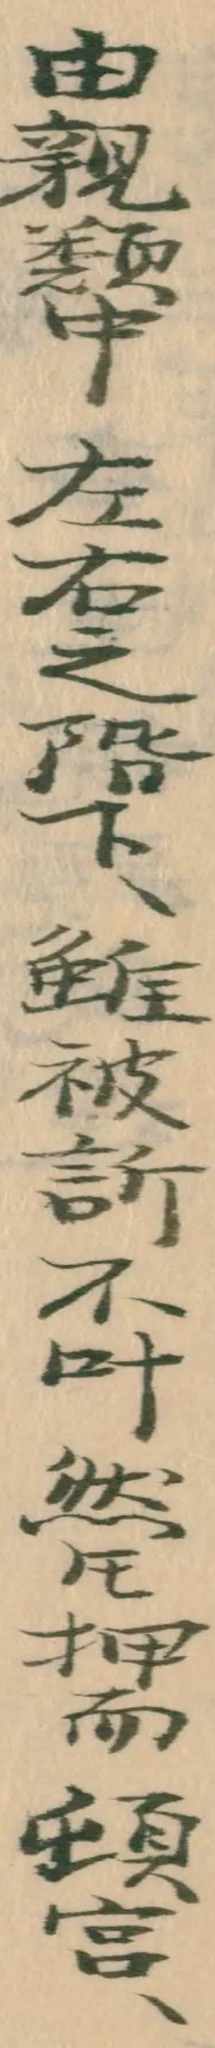由親類中左右之階下へ雖被訴不叶然トモ押而頓宮へ
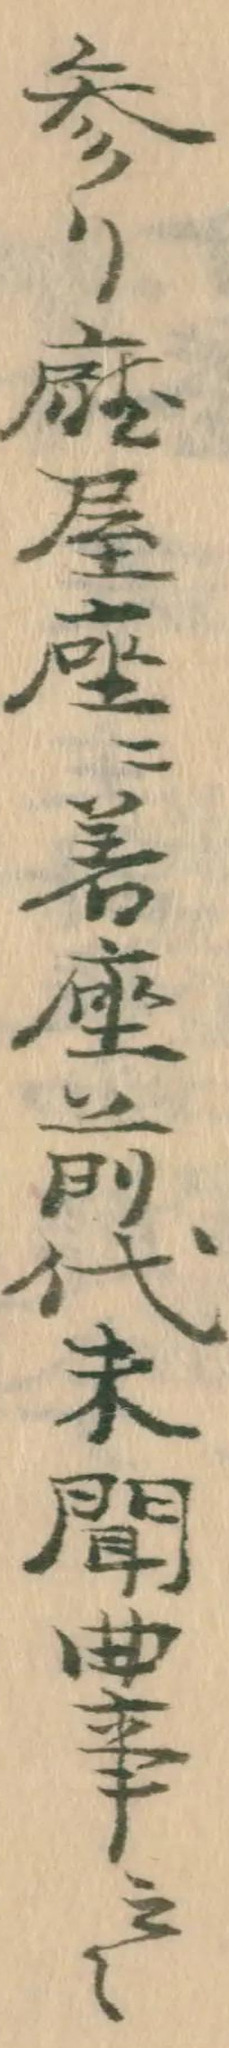参リ庁屋座ニ着座前代未聞曲事云々
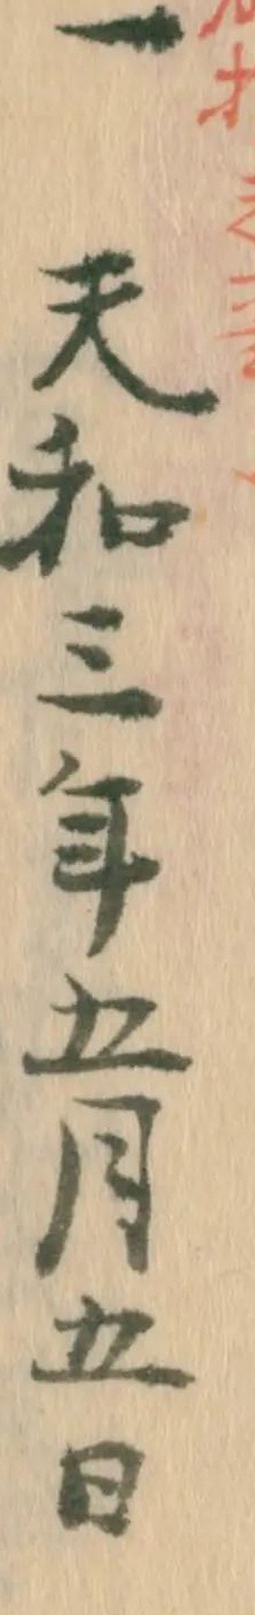一天和三年五月五日
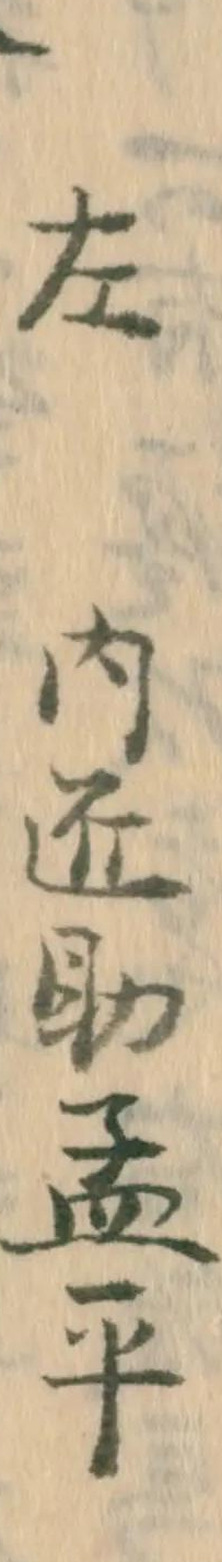左内匠助孟平
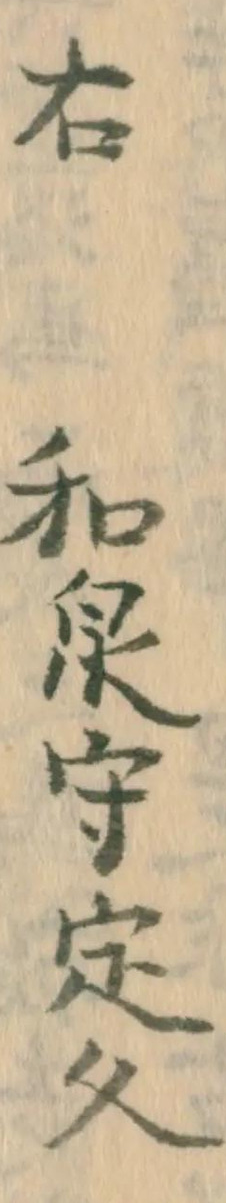右和泉守定久
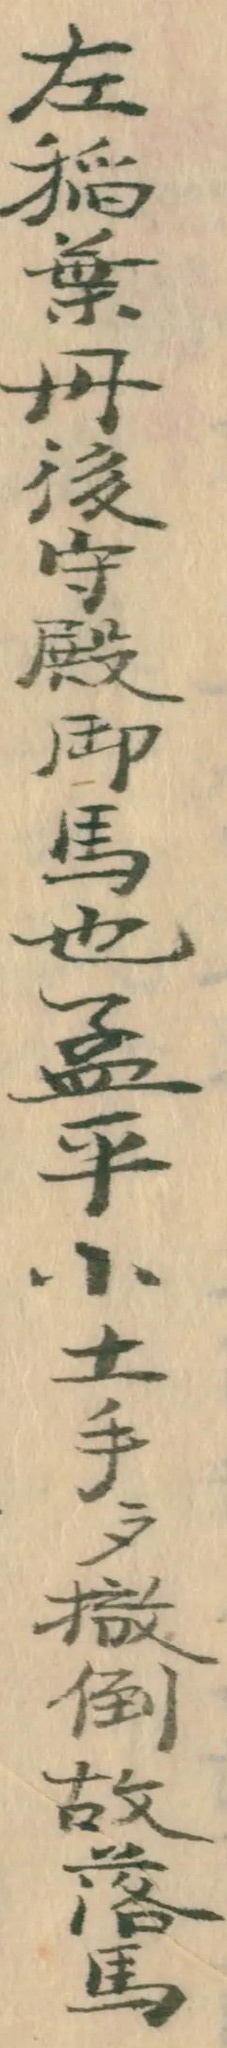左稲葉丹後守殿御馬也孟平小土手ニシテ撤倒故落馬
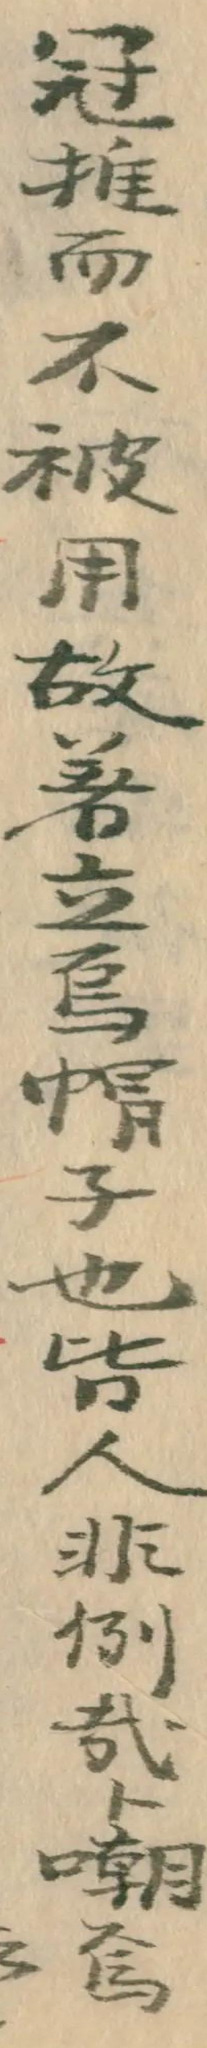冠推而不被用故着立烏帽子也皆人非例哉ト嘲焉云々

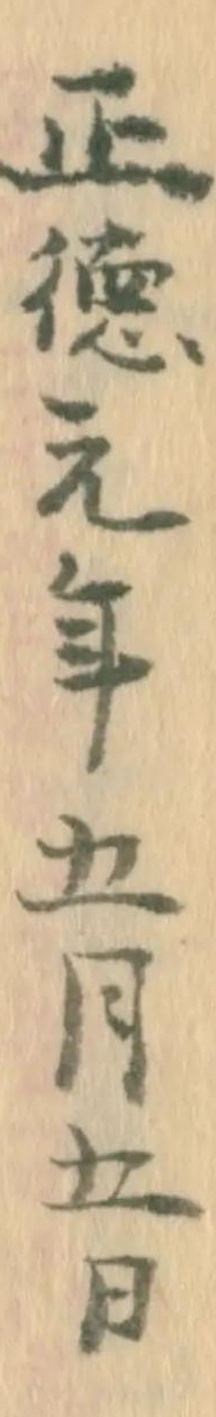一正徳元年五月五日
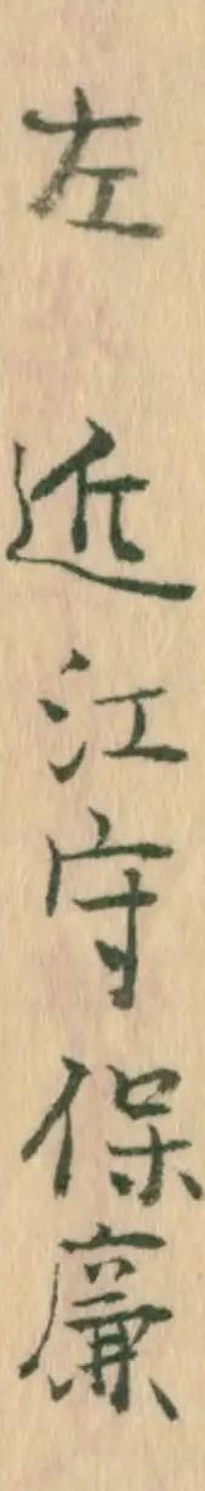左近江守保廉
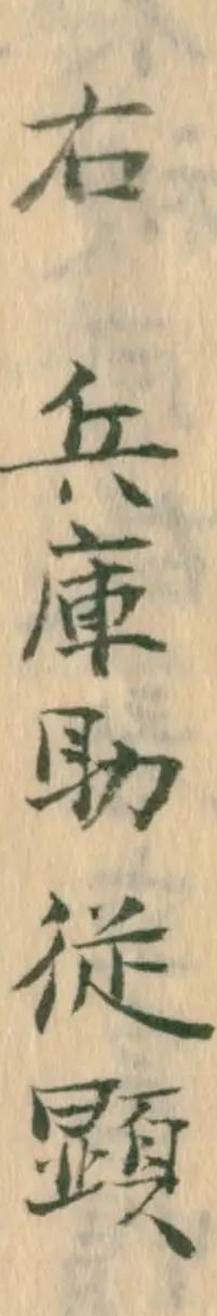右兵庫助従顕
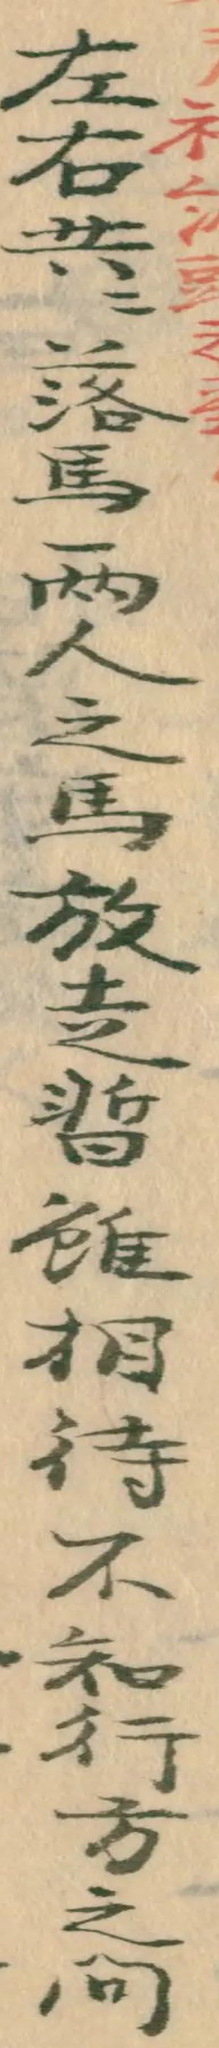左右共ニ落馬両人之馬放走暫雖相待不知行方之間
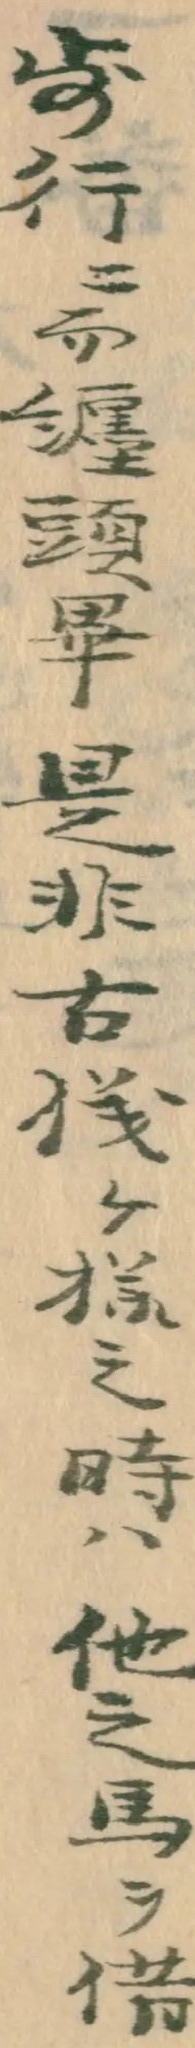歩行ニ而纏頭畢是非古儀ケ様之時ハ他之馬ヲ借
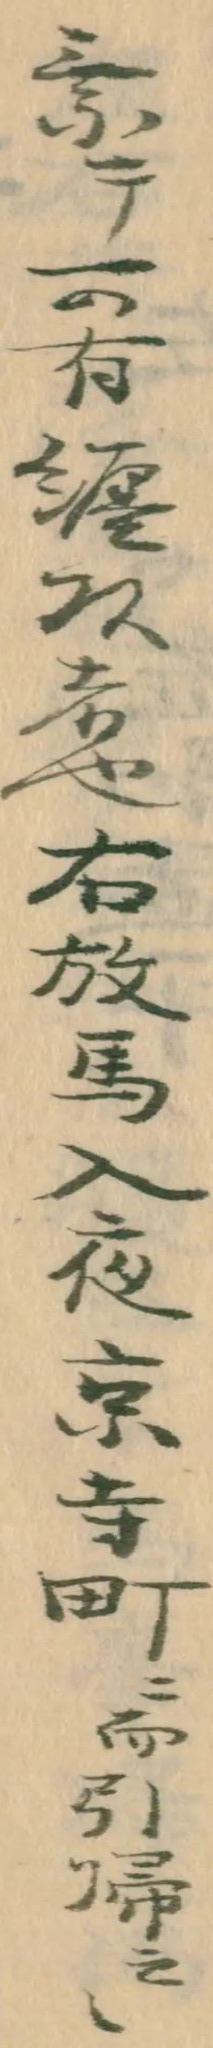乗テ可有纏頭者也右放馬入夜京寺町ニ而引帰云々
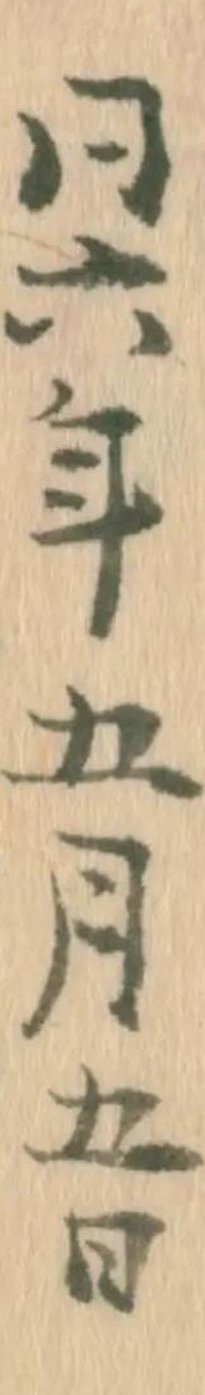一同六年五月五日
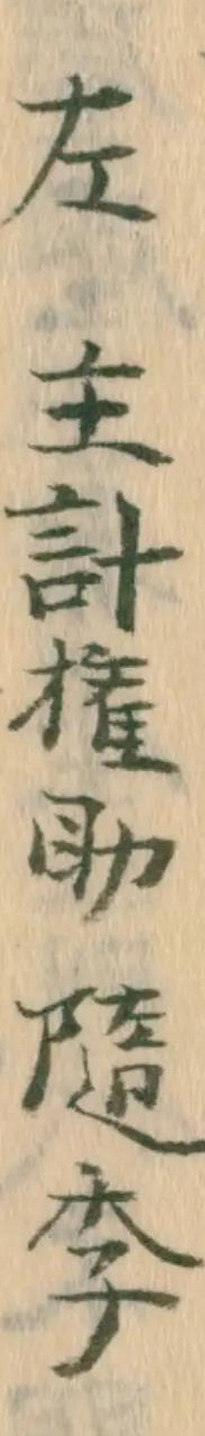左主計権助随季
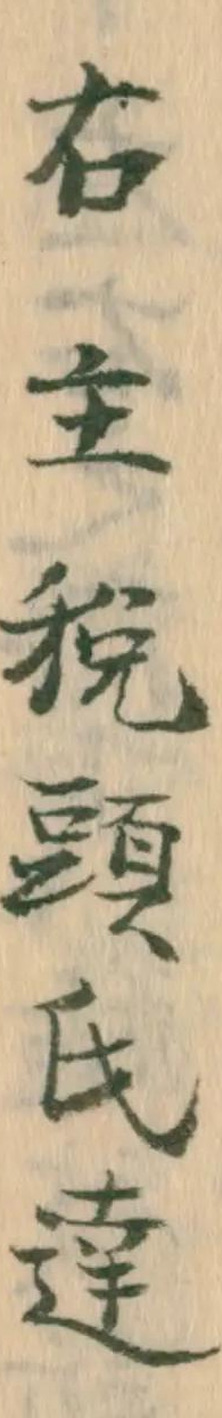右主税頭氏達
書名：賀茂社記録. 第12冊
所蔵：国立国会図書館 National Diet Library, JAPAN
